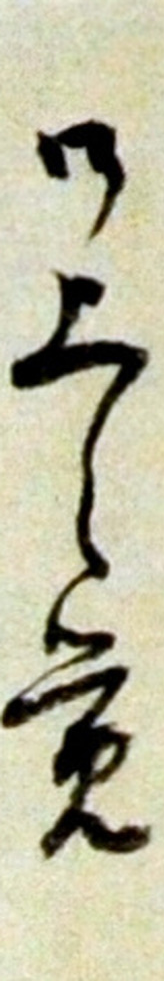口上之覚
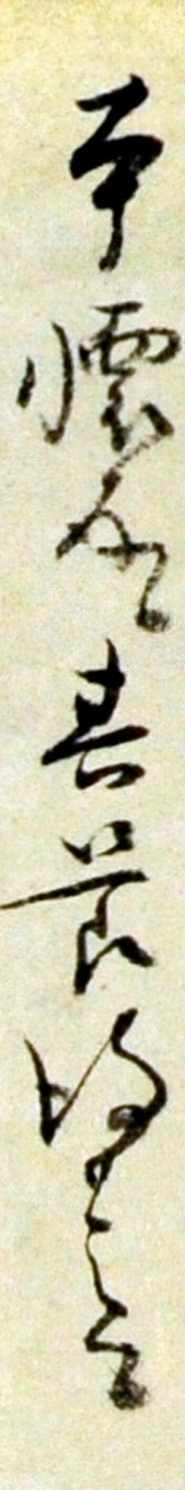本懐存候其節得御意候
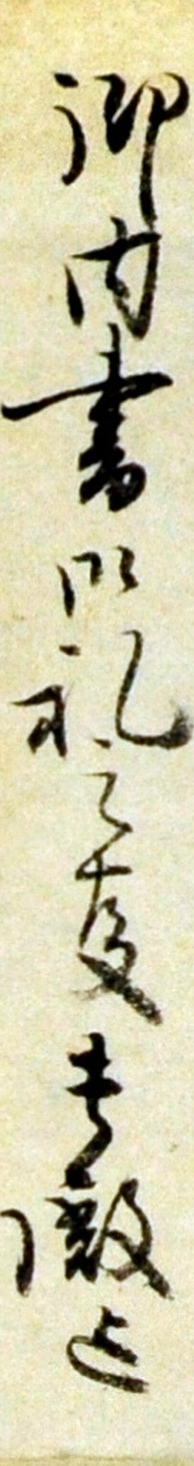御内書御札之叓貴殿迄
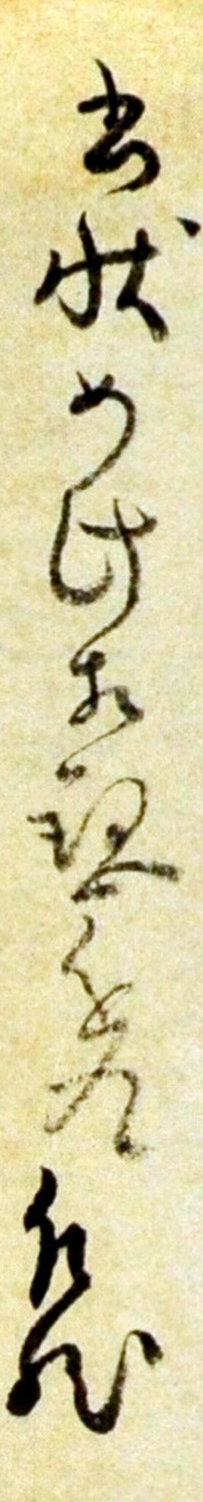書状如此相認進入候乍然
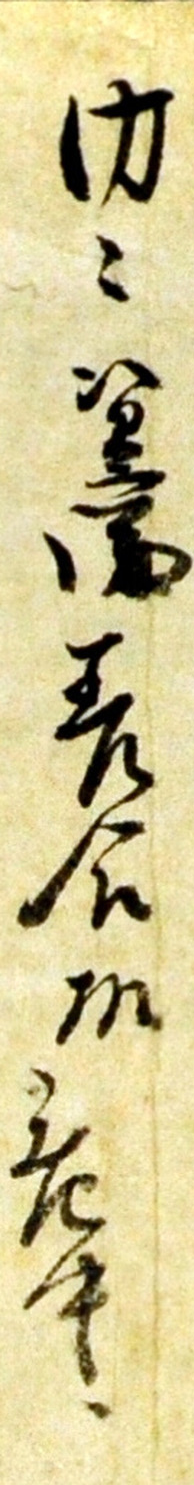内々▢▢差合故御老中へ
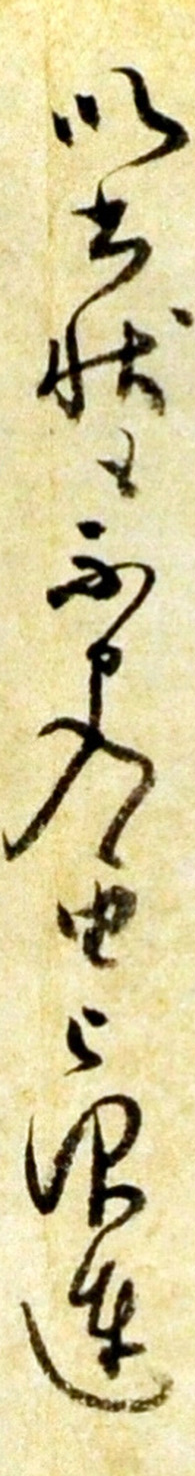御書状も不申入候由被仰達
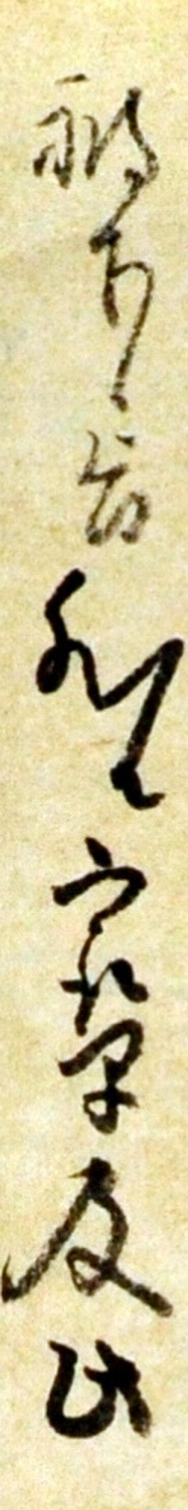被下候旨然而最早及此
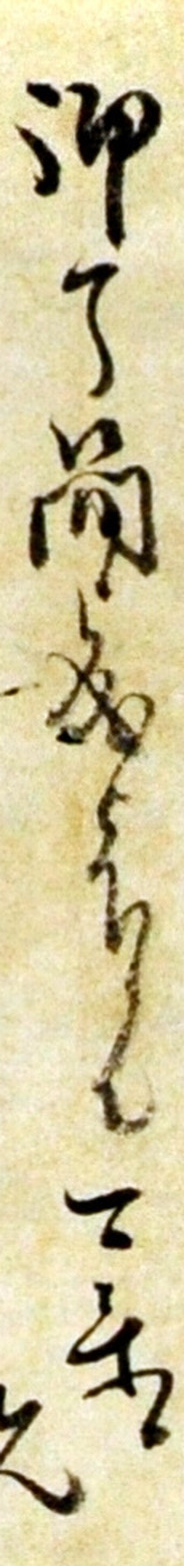御了簡被成被下候て可被示候先
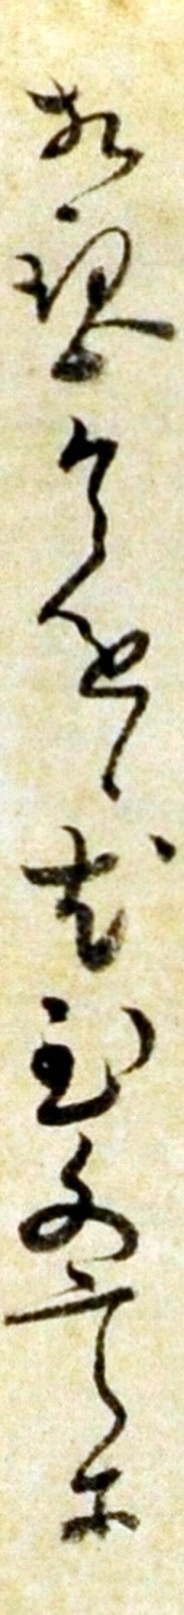相認令進候尤至文定等
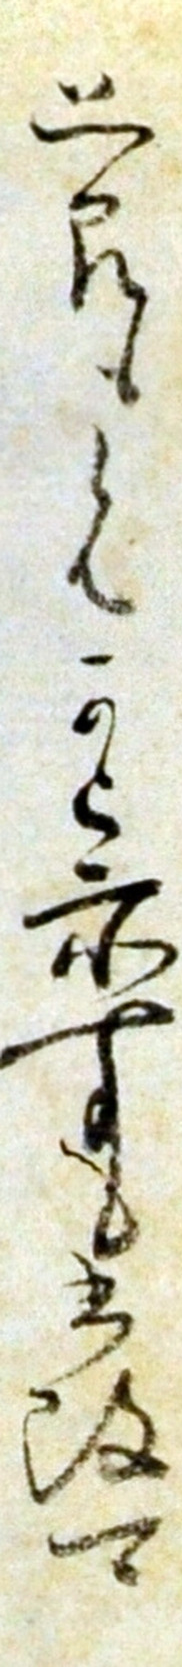思召も候はゝ可被示聞候書改可
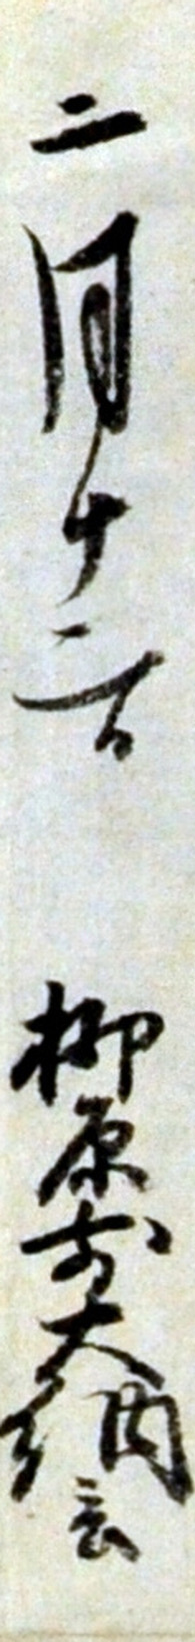二月十二日柳原前大納言
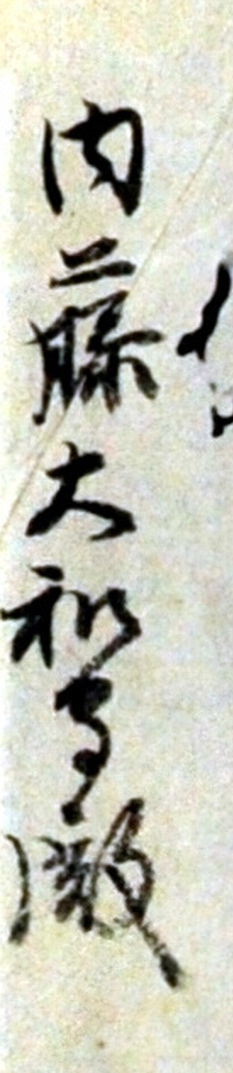内藤大和守殿
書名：口上之覚
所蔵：伊那市立高遠町図書館・合同会社AMANE
